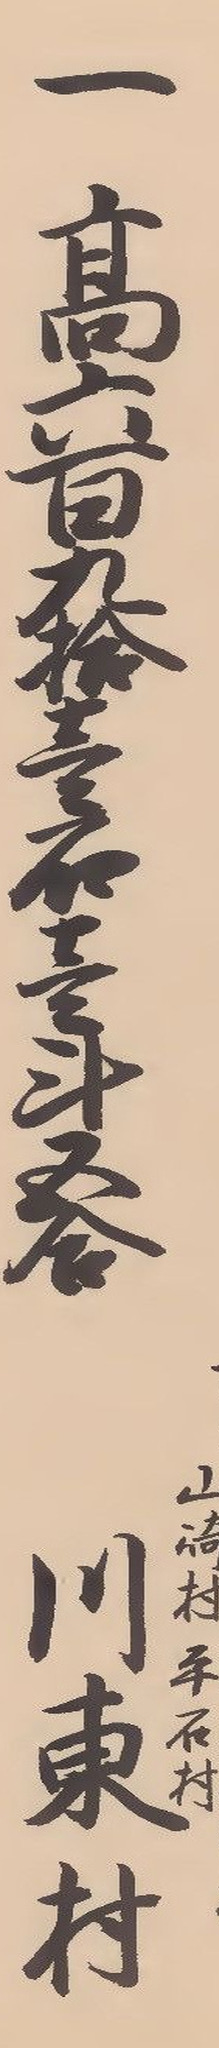一高六百九拾壱石壱斗五合川東村
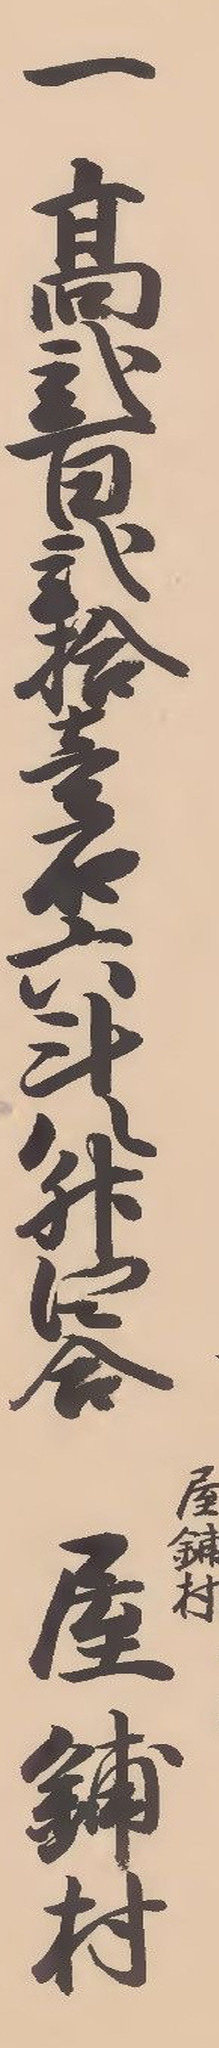一高弐百弐拾壱石六弐八升四合屋鋪村
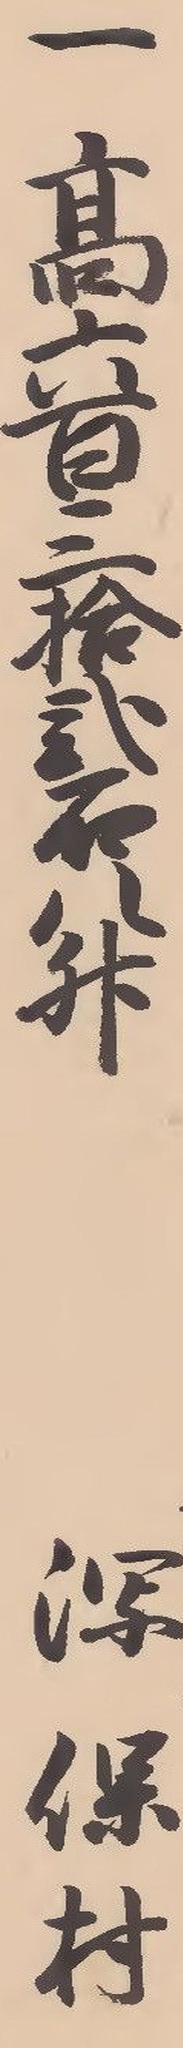一高六百三拾弐石八升潟保村
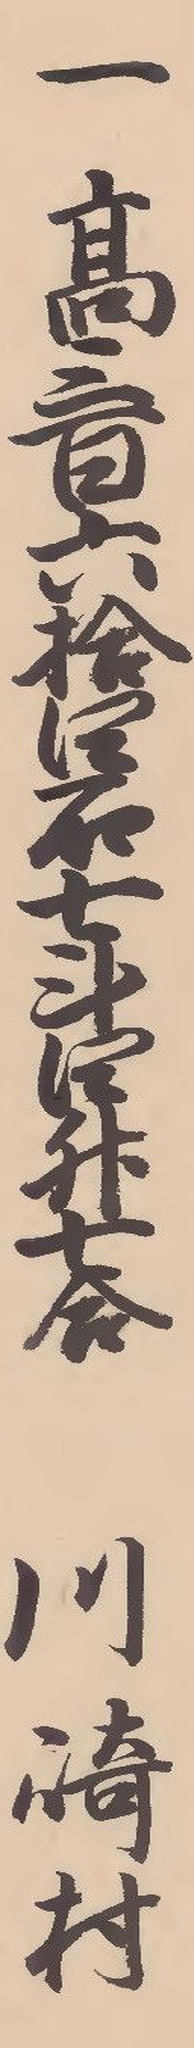一高三百六拾四石七斗四升七合川崎村
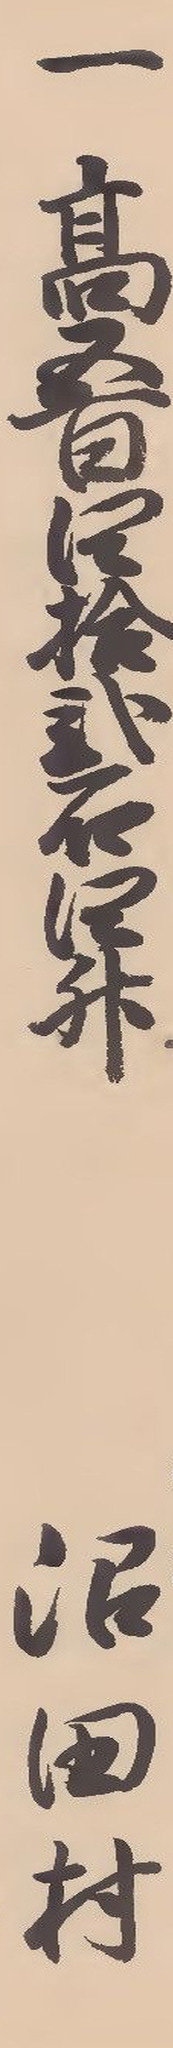一高五百四拾弐石四升沼田村
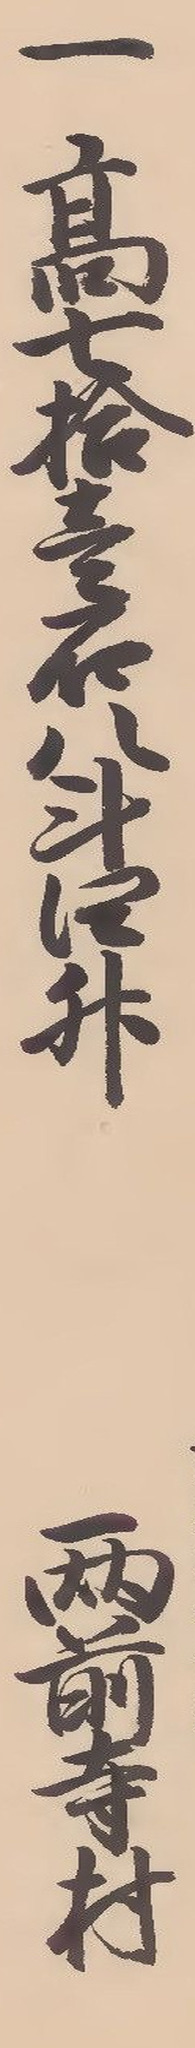一高七拾壱石八斗四升両前寺村

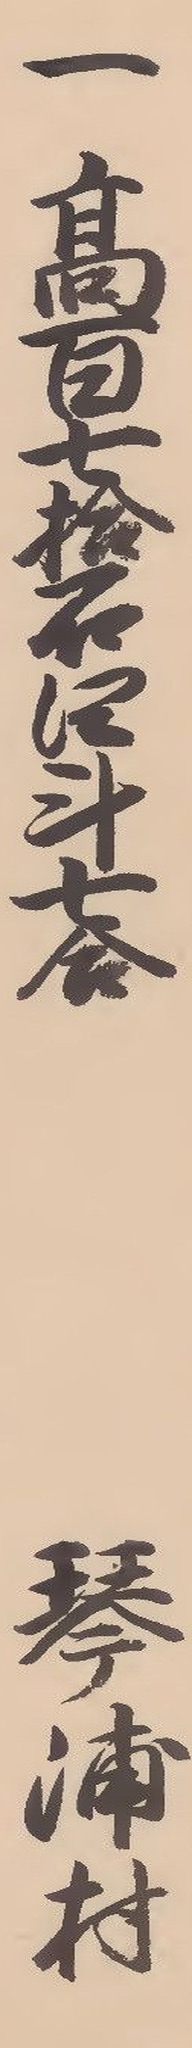一高百七拾石四斗七合琴浦村
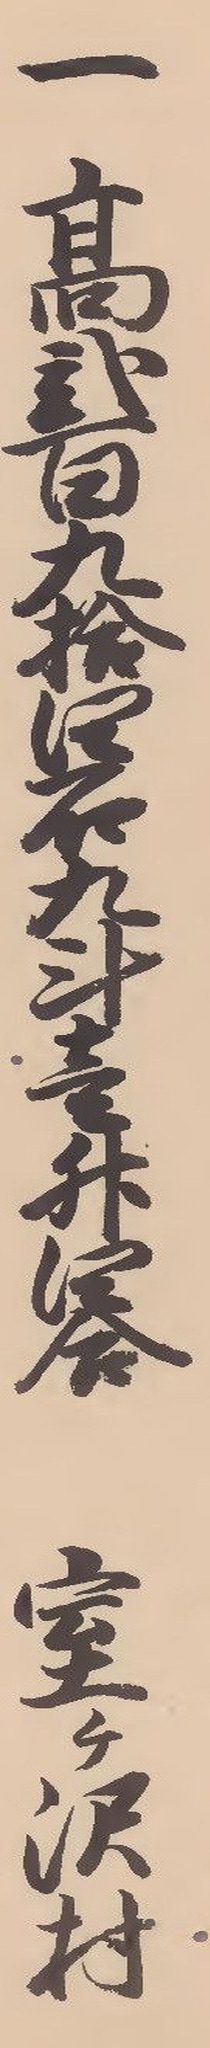一高弐百九拾四石九斗壱升四合室ヶ沢村
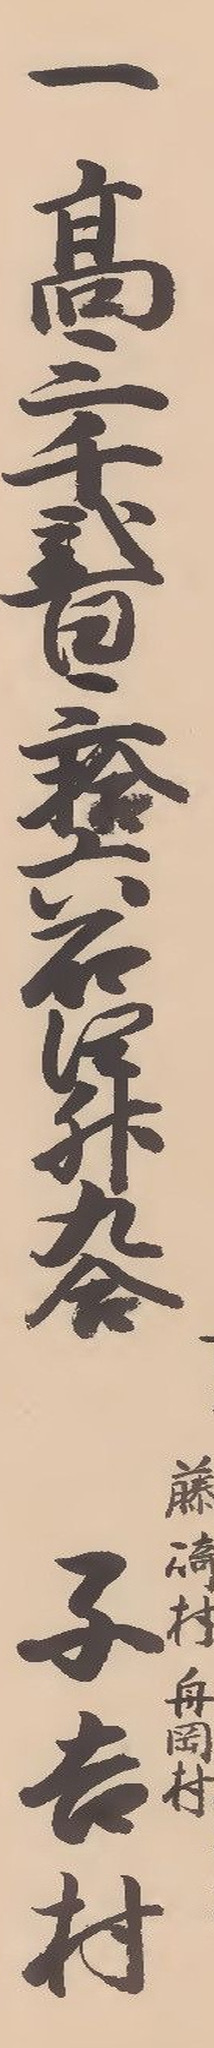一高三千弐百三拾六石四升九合子吉村
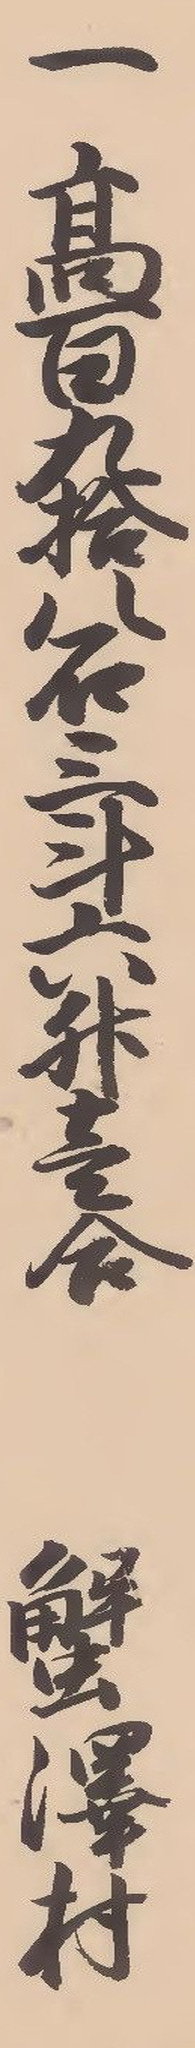一高百九拾八石三斗六升壱合蟹沢村
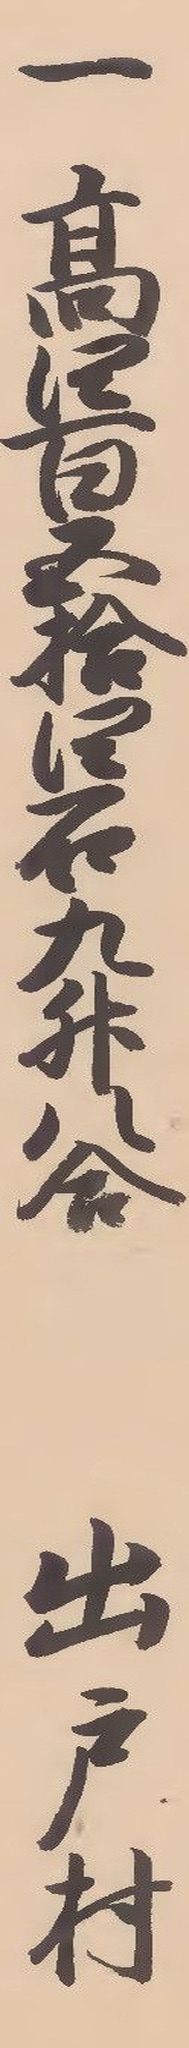一高四百五拾四石九升八合出戸村
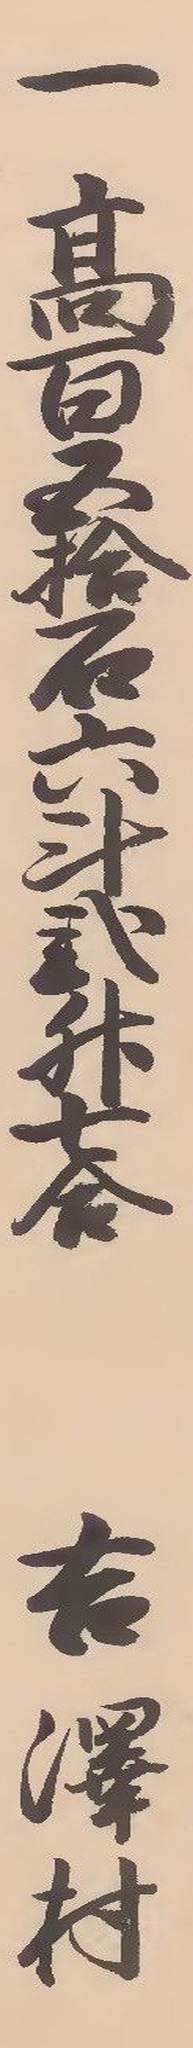一高百五拾石六斗弐升七合吉沢村
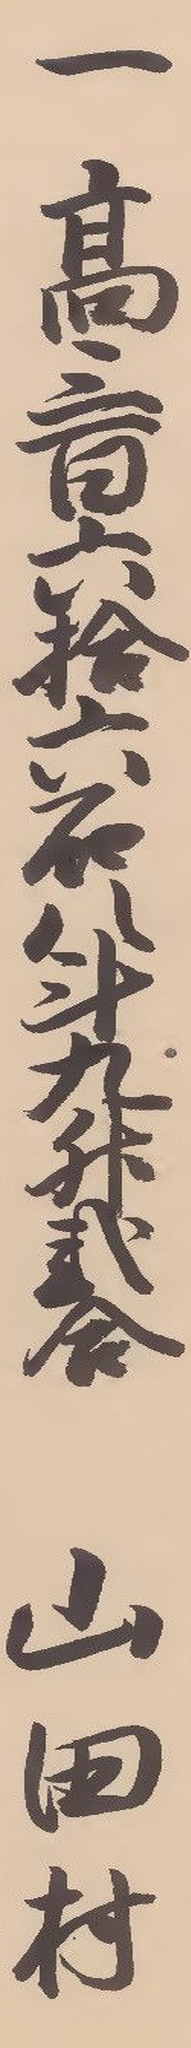一高三百六拾六石八斗九升弐合山田村
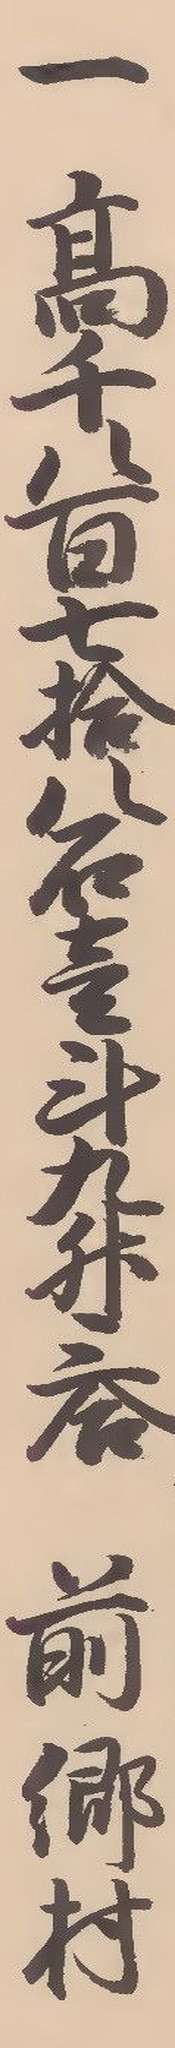一高千八百七拾八石壱斗九升三合前郷村

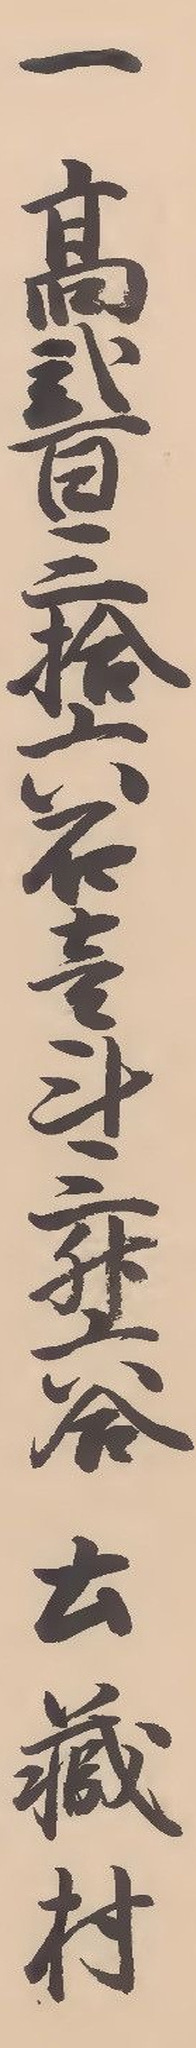一高弐百三拾六石壱斗三升六合土蔵村
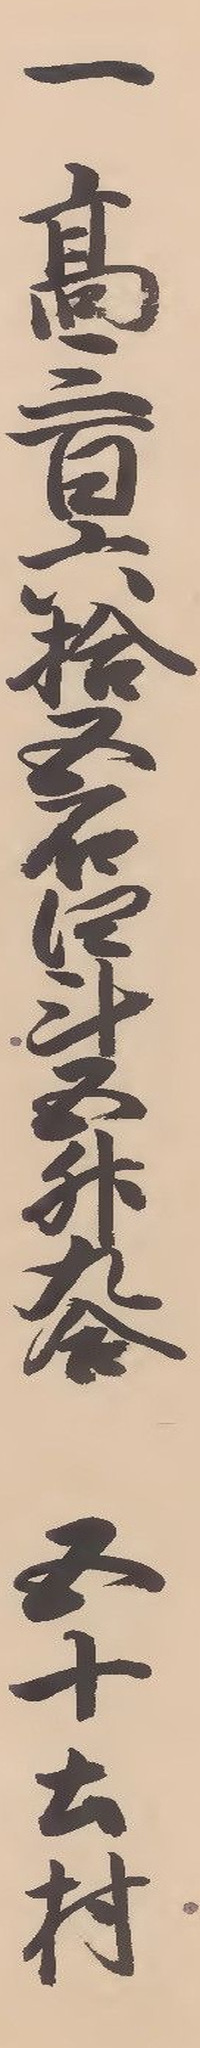一高三百六拾五石四斗五升九合五十土村
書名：出羽国郷帳　５
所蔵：国立公文書館 National Archives of Japan
